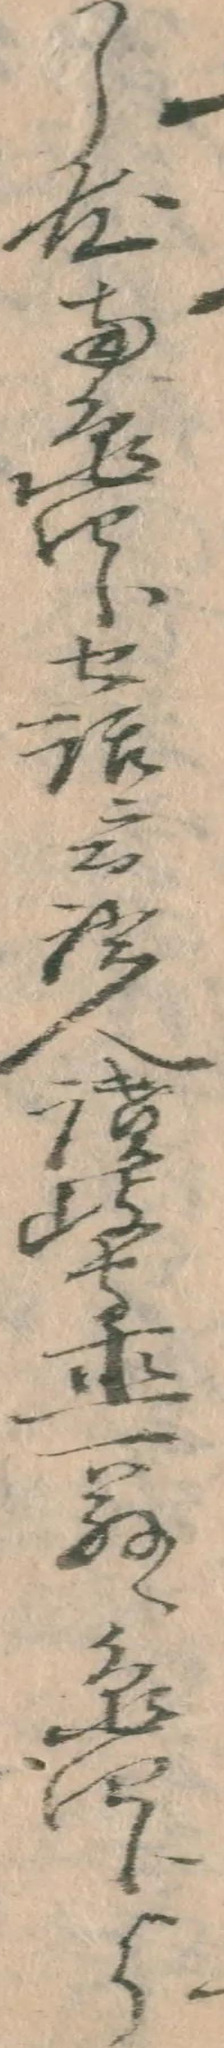了尤南亀四郎セ話二而證人讃岐守直一翁へ亀四郎より
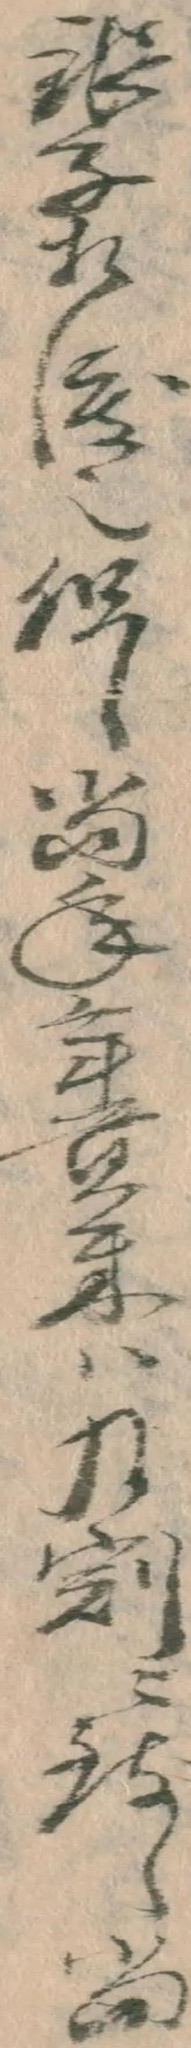銀子相渡也但し當年年貢米ハ月割ニ致し當
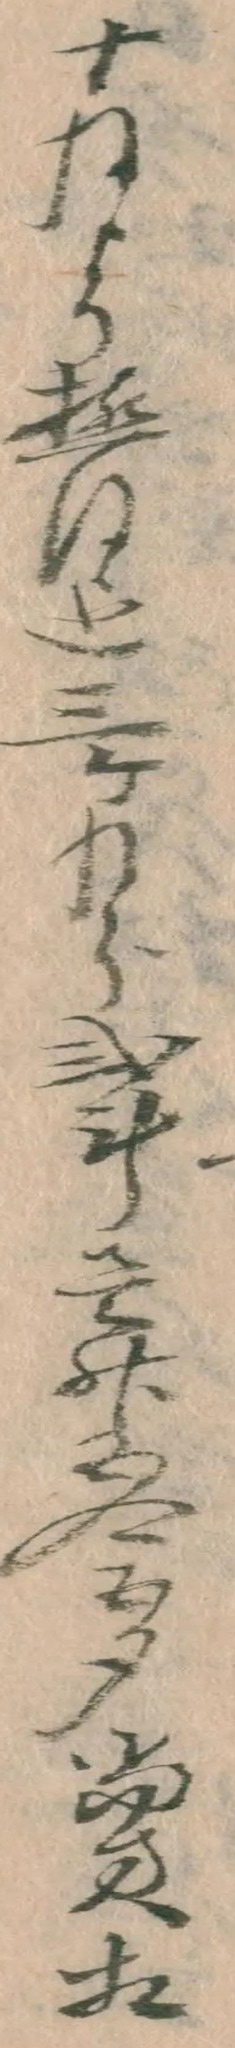十月より極月迄三ケ月分弐斗壱升五合五勺當方へ相
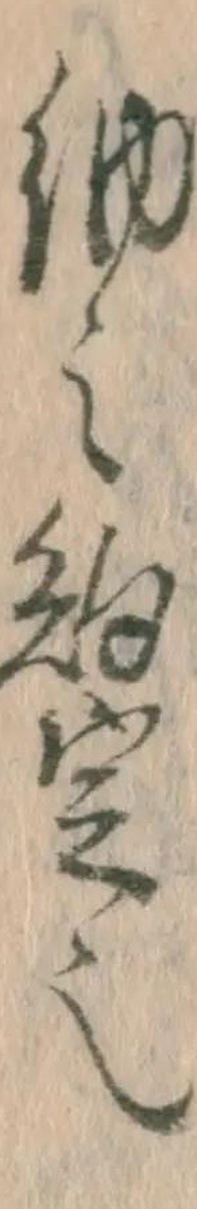納之約定也
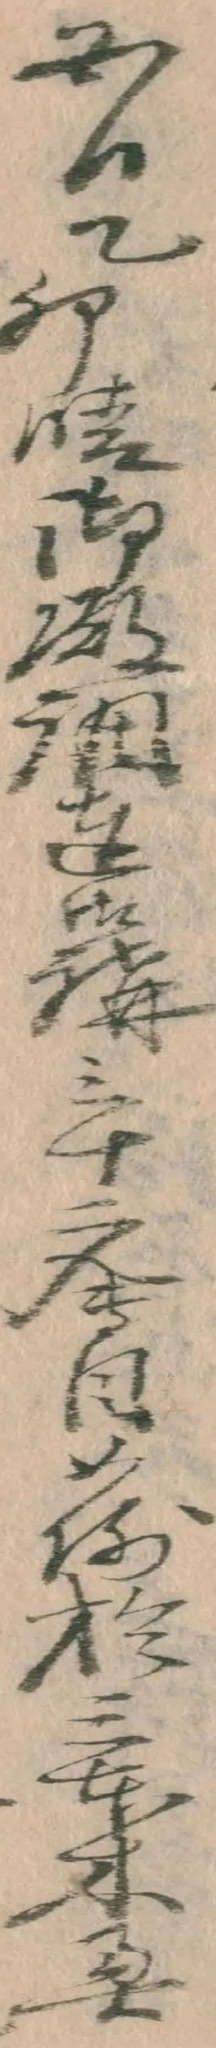五日乙卯晴御殿調達御構三十二會目如例於三本木奥
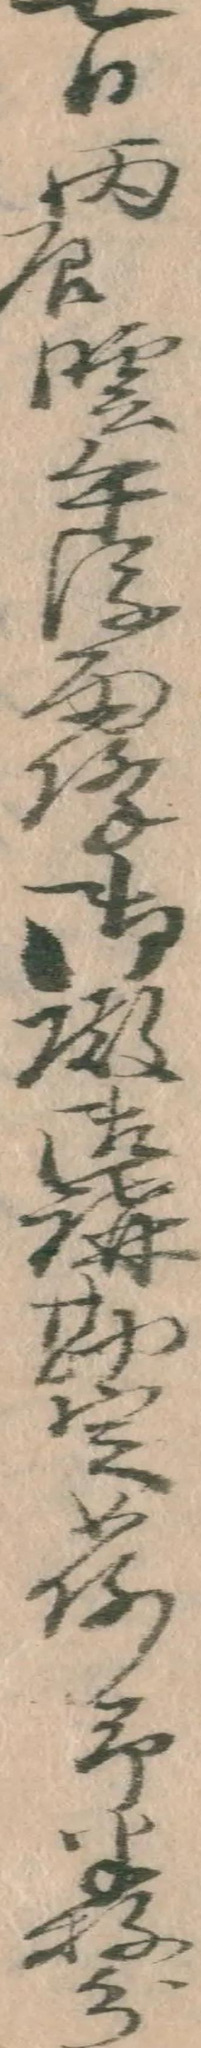七日丙辰曇午後雨降御殿御講勘定如例予半枚分
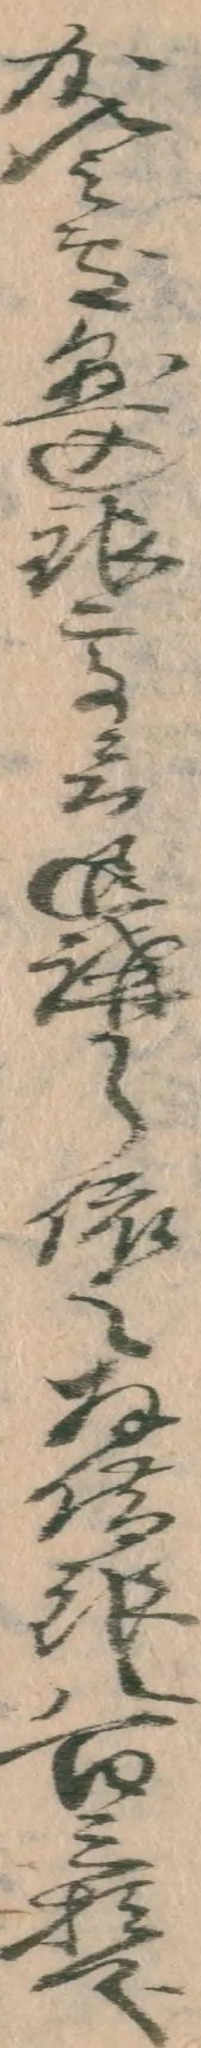加入之處懸込銀高ニ而退講了依之拝借銀八百三拾匁
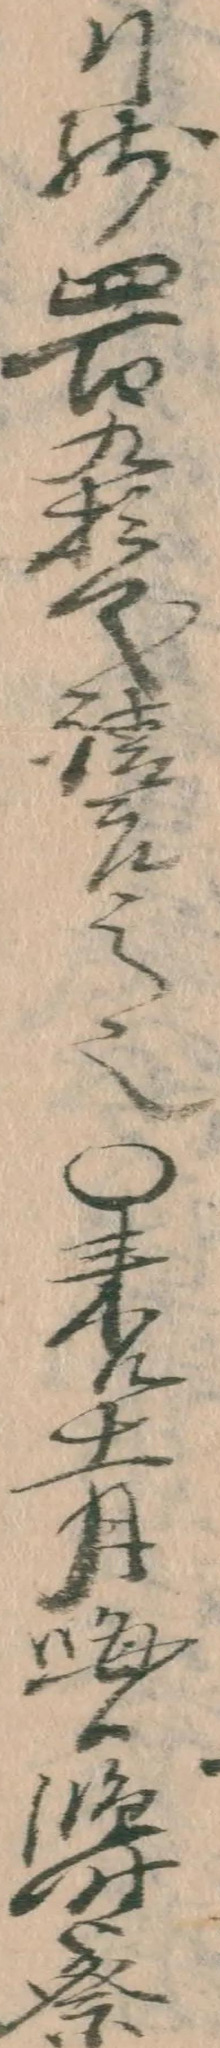引残四百九拾文請取之也〇来ル十一月晦日臨時御祭
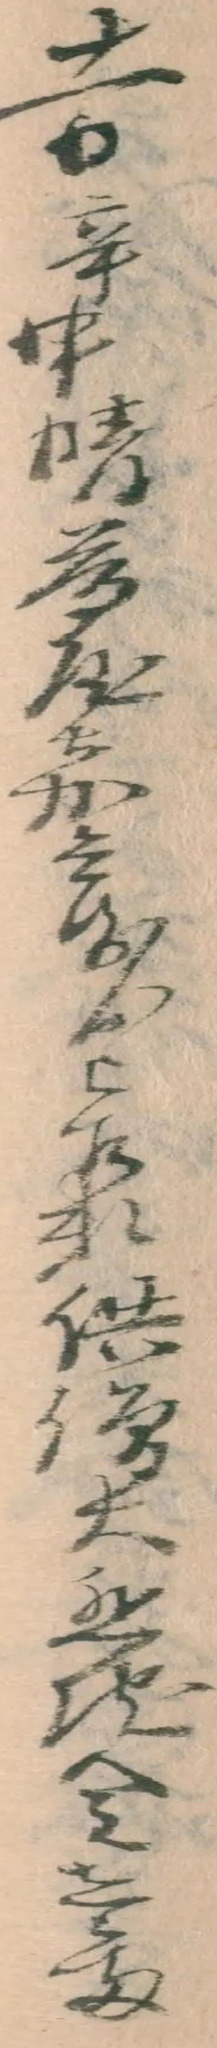十一日辛申晴藤屋嘉兵衛ゟ被相頼供僧大丞院金壱両
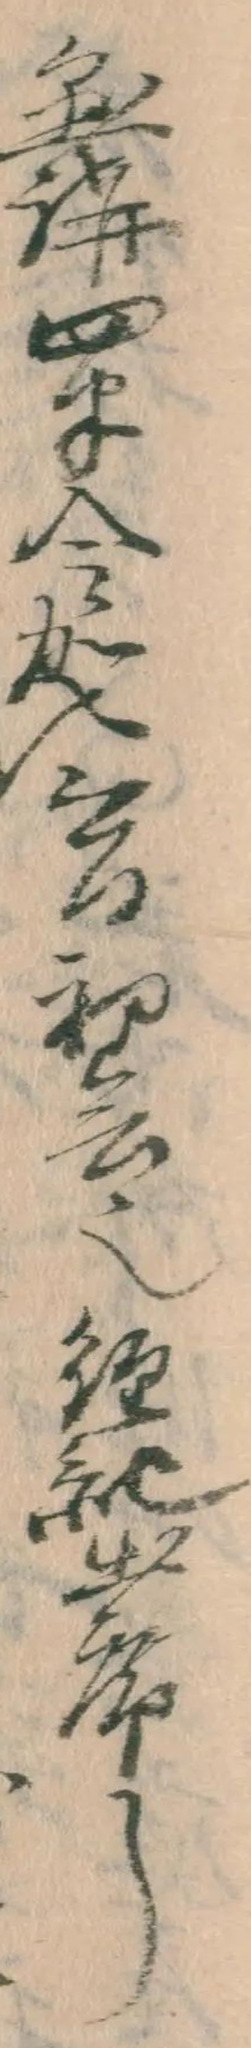講四半令加入今日初會也経紀出席了
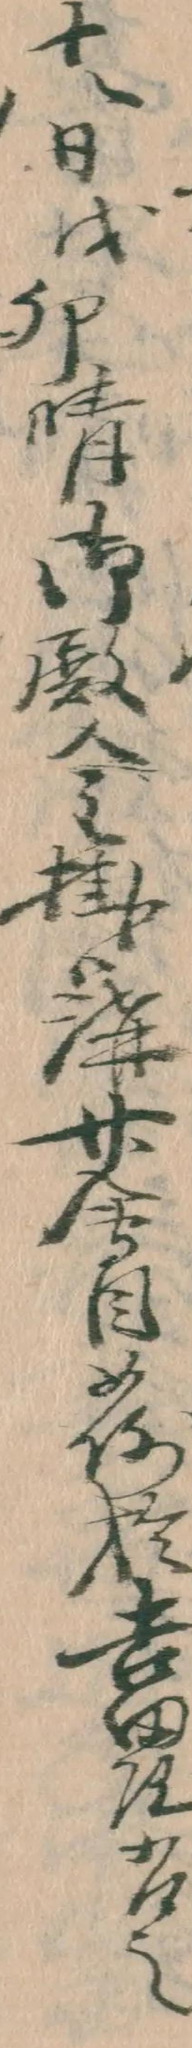十八日戊卯晴御殿金掛御講廿會目如例於吉田屋有之
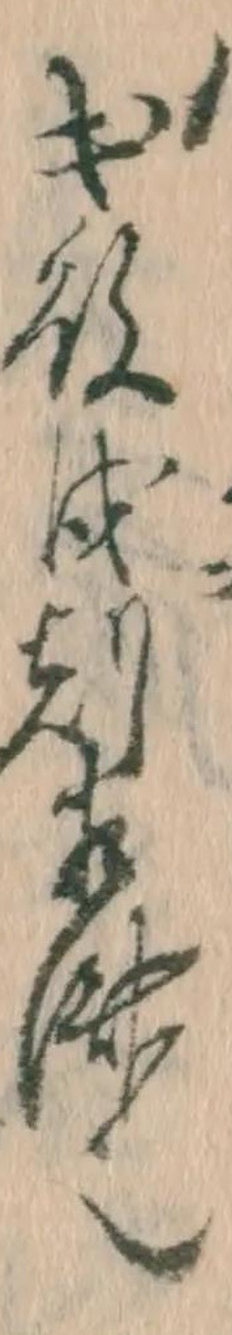出役戌刻相済也
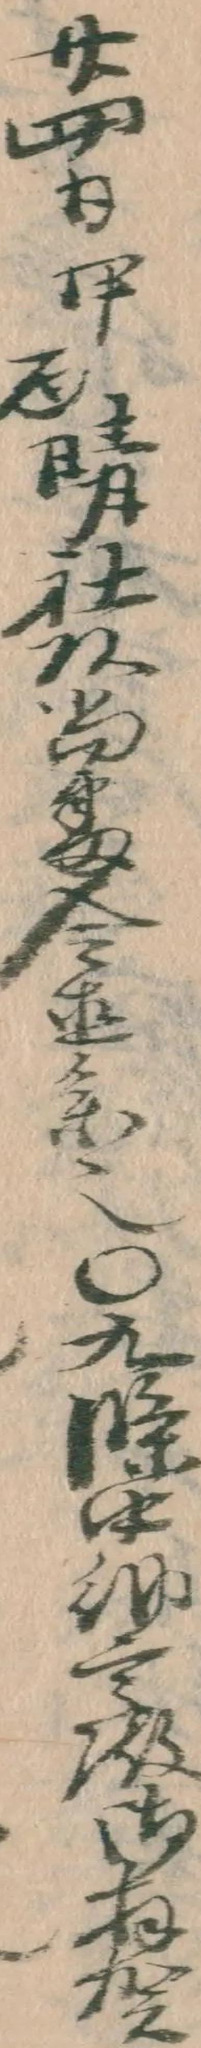廿四日甲酉晴社頭當番令直参也○九條中納言殿御拝領
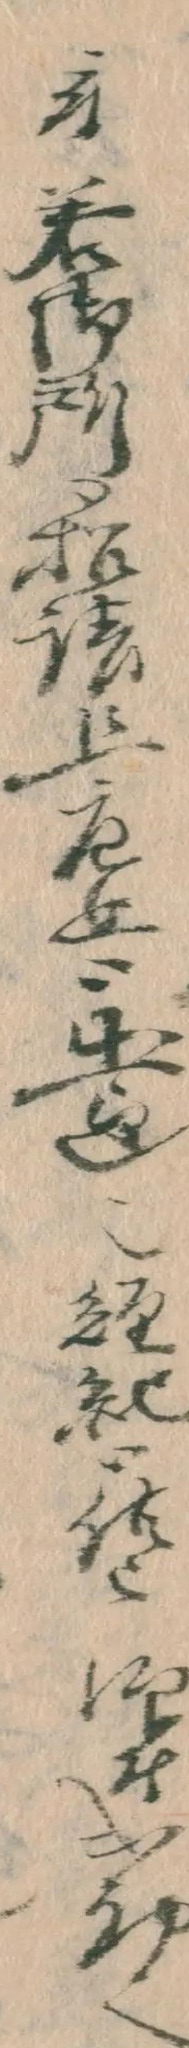ニ付若御所御招請且庭上御出迎也経紀御供被仰付出勤之
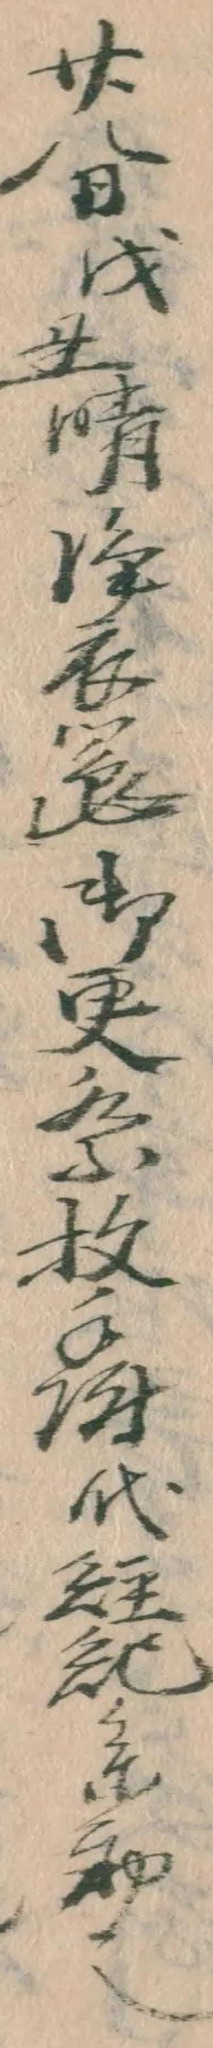廿八日戊丑晴浄衣鬮御更祭牧手附代経紀参勤也
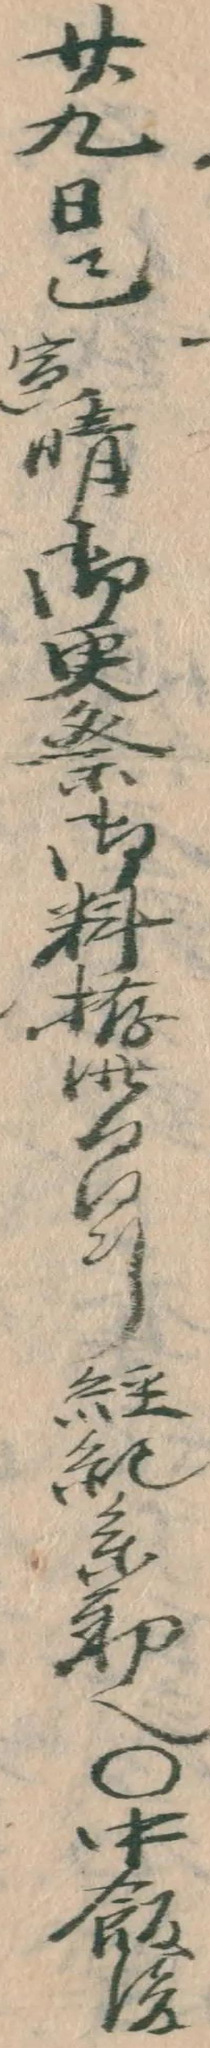廿九日己寅晴御更祭御料拵昨日同断経紀参勤也〇中飯後
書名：賀茂社記録. 第67冊
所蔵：国立国会図書館 National Diet Library, JAPAN
